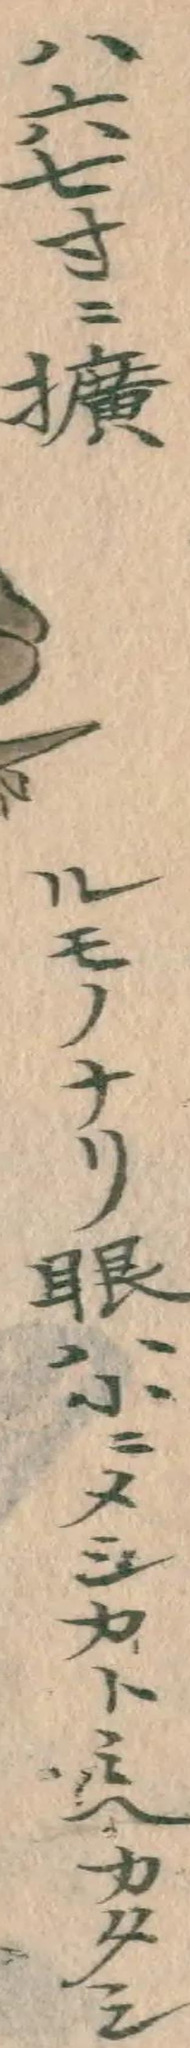ハ六七寸ニ拡ルモノナリ眼ハ小ニシテシカトミヘカタシ
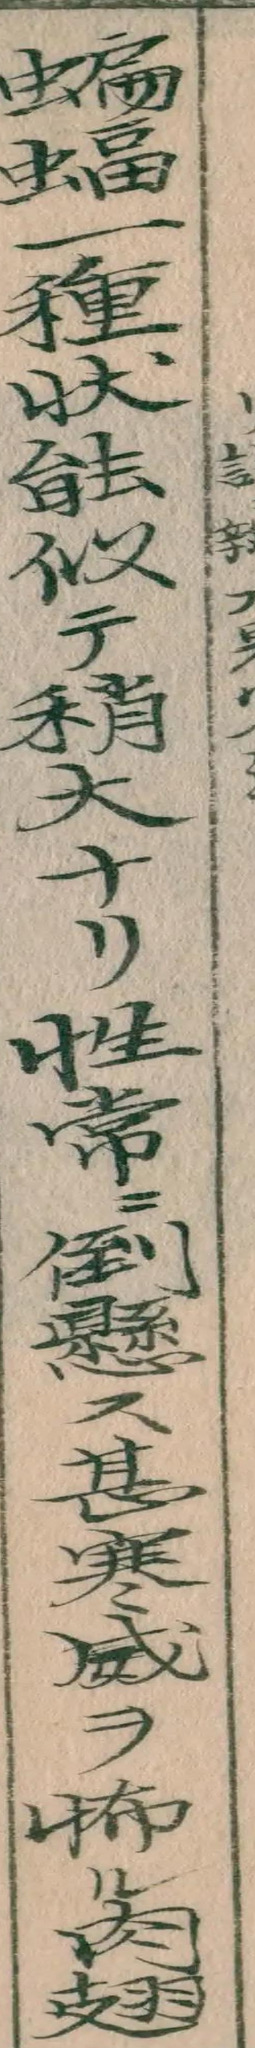蝙蝠一種状能似テ稍大ナリ性常ニ倒懸ス甚寒威ヲ怖ル肉翅
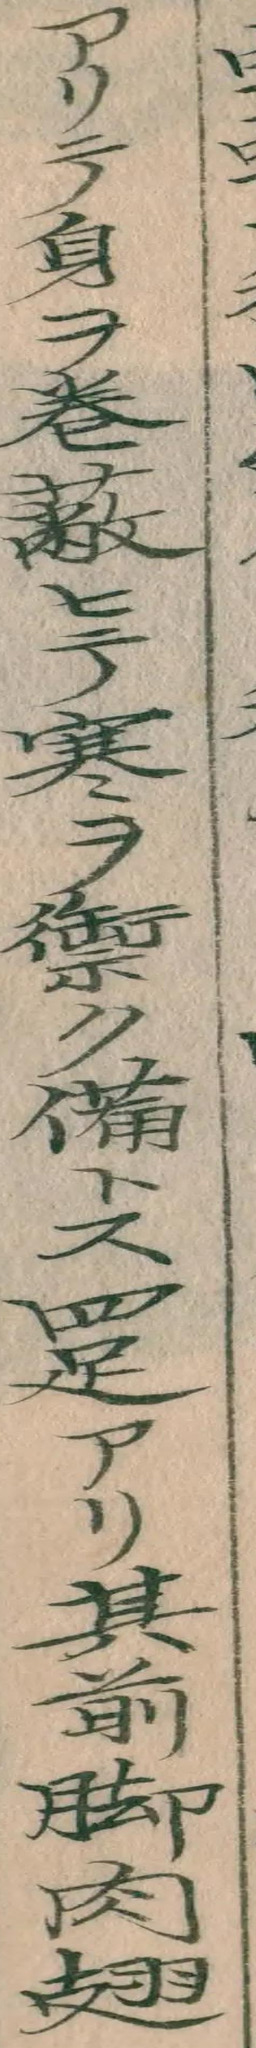アリテ身ヲ巻蔽ヒテ寒ヲ禦ク備トス四足アリ其前脚肉翅
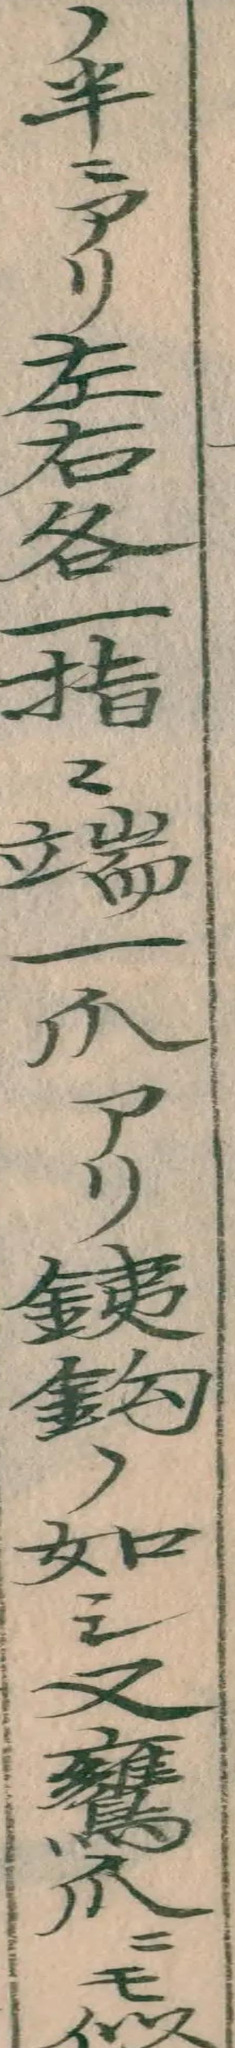ノ半ニアリ左右各一指々端一爪アリ銕鉤ノ如シ又爪ニモ似
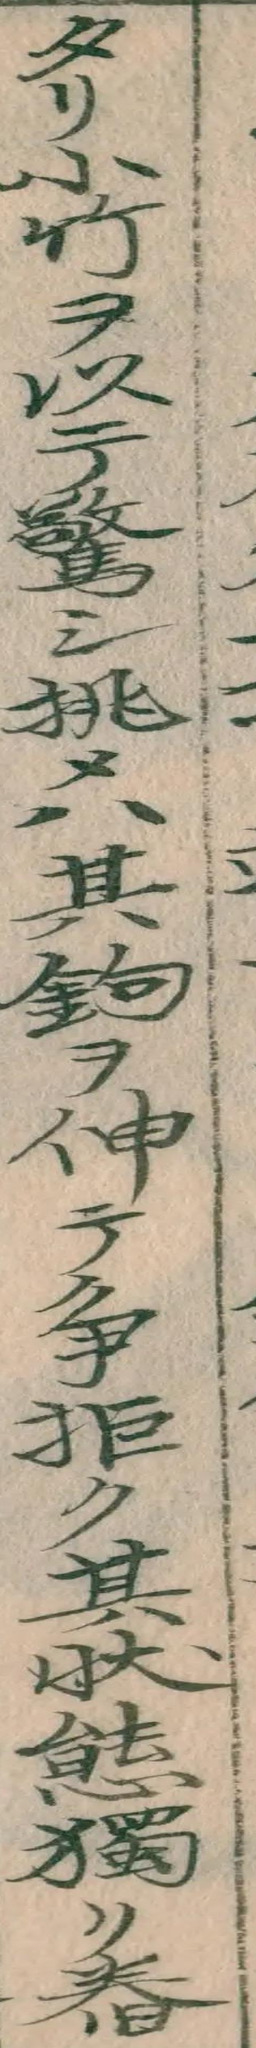タリ小竹ヲ以テ驚シ挑メハ其鉤ヲ伸テ争拒ク其状態独リ㫪
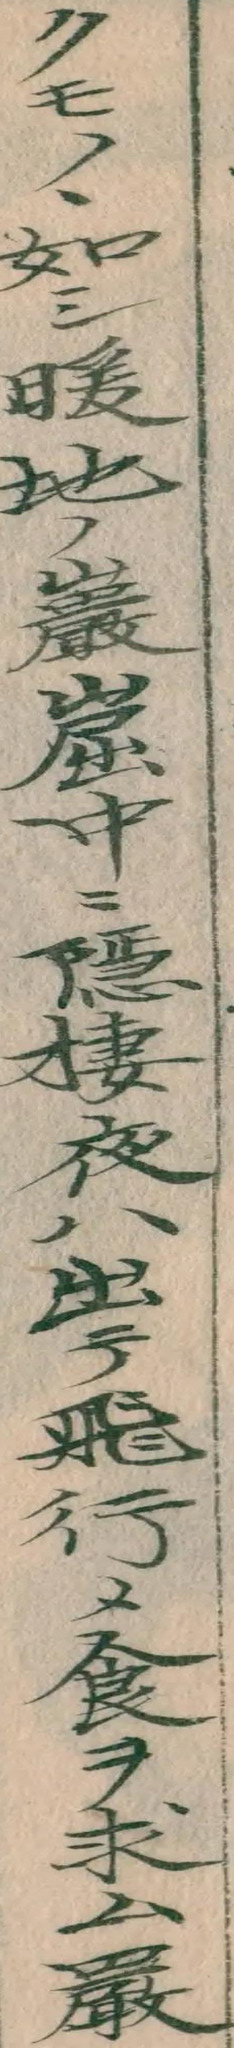クモノヽ如シ暖地ノ巌崫中ニ隠棲夜ハ出テ飛行シテ食ヲ求ム厳
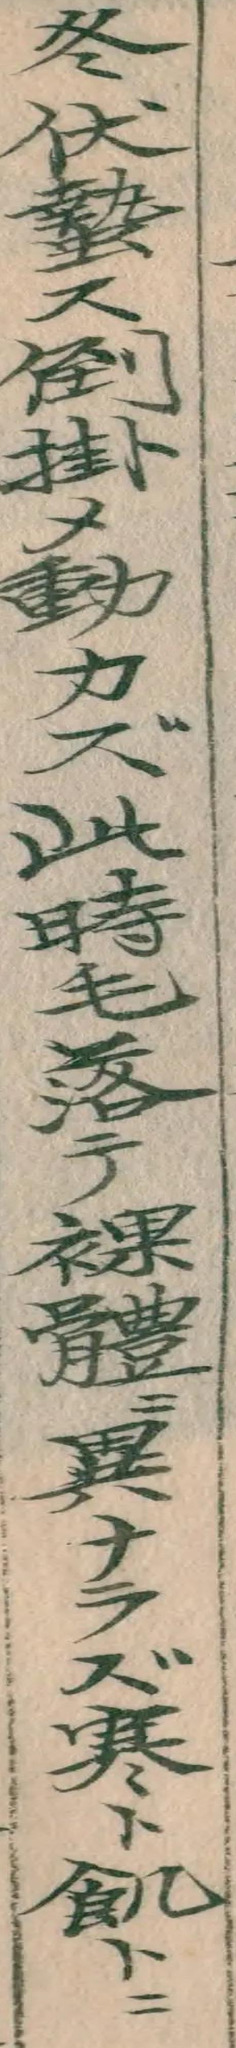冬伏蟄ス倒掛シテ動カズ此時毛落テ裸體ニ異ナラズ寒ト飢トニ
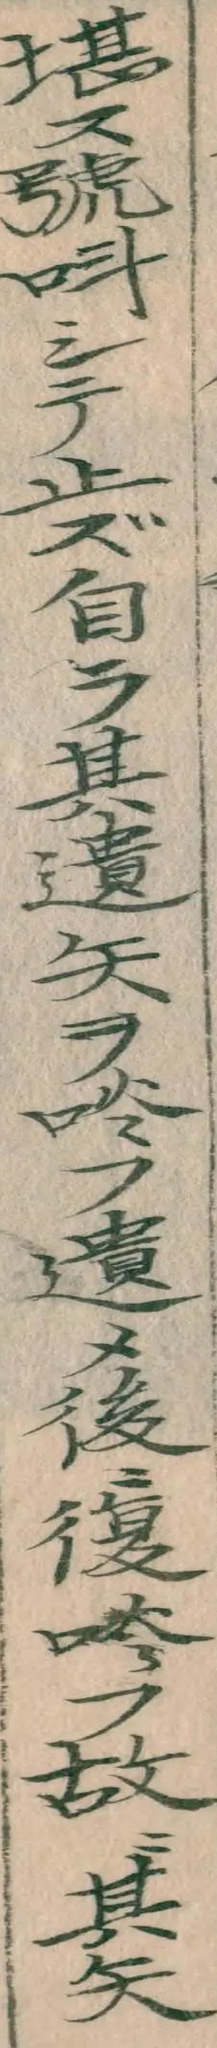堪ス號呌シテ止ズ自ラ其遺矢ヲ啖フ遺シテ後ニ復啖フ故ニ甚矢
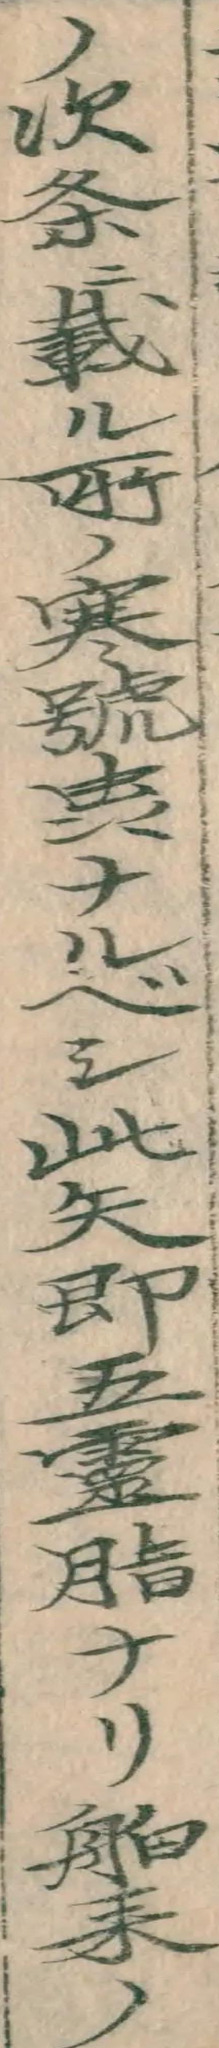ノ次条ニ載ル所ノ寒號蟲ナルベシ此矢即五霊脂ナリ舶来ノ

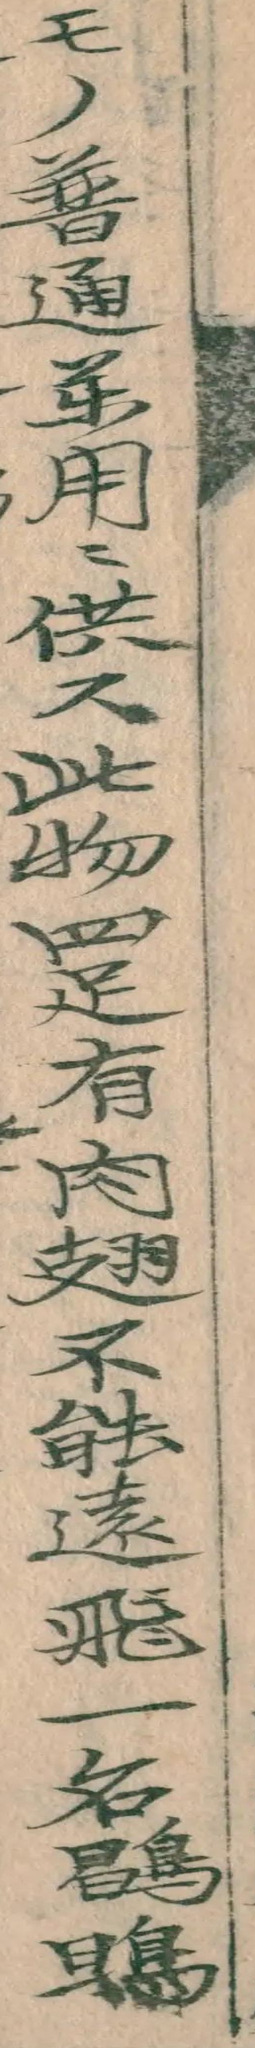モノ普通薬用ニ供ス此物四足有肉翅不能飛一名鴠
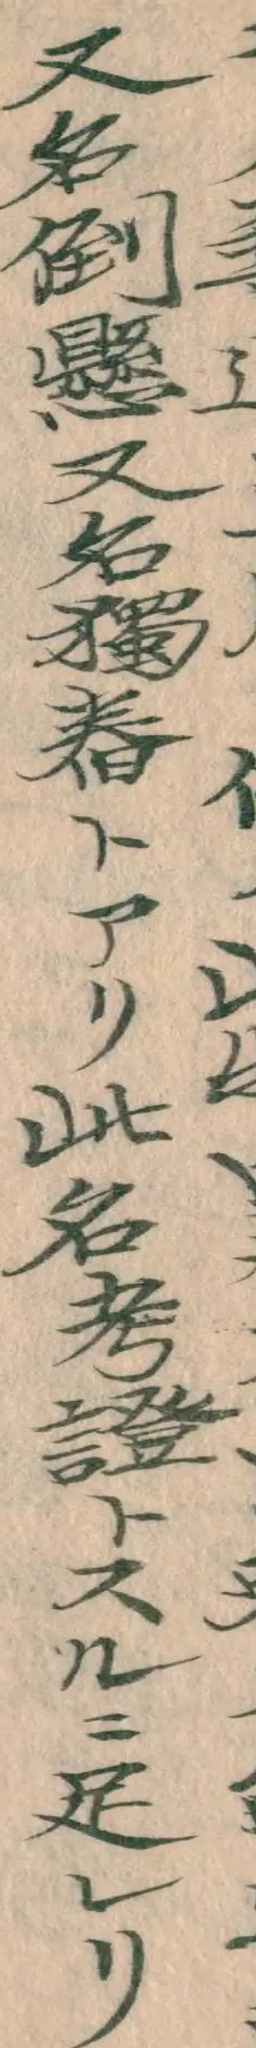又名倒懸又名獨㫪トアリ此名考證トスルニ足レリ

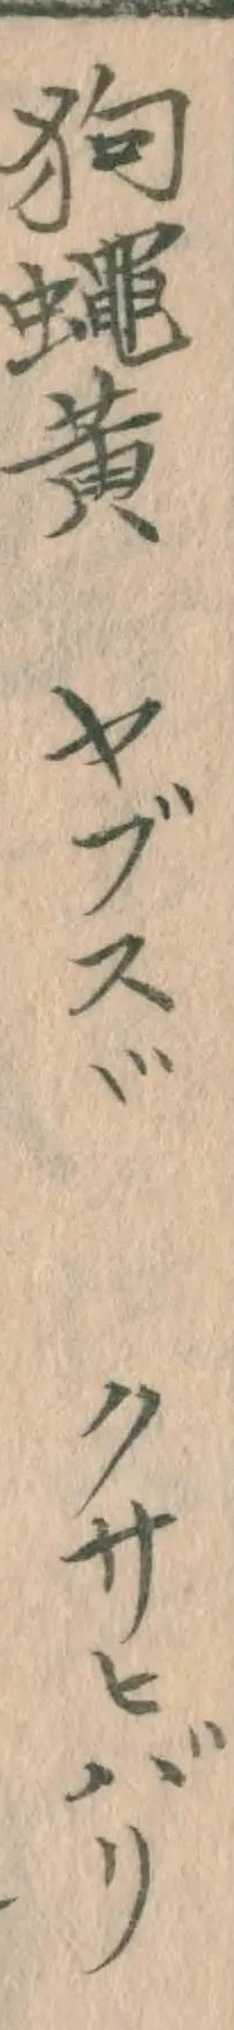狗蠅黄ヤブスヾクサヒバリ
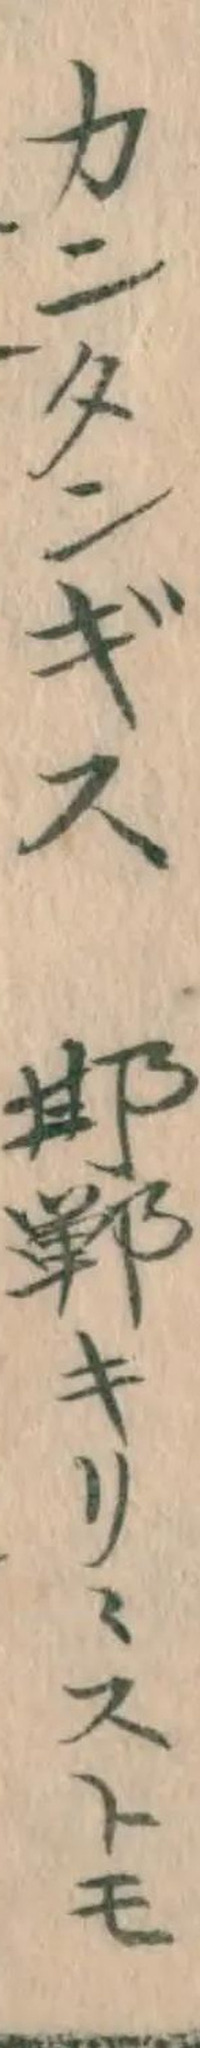カンタンギス邯鄲キリ々ストモ
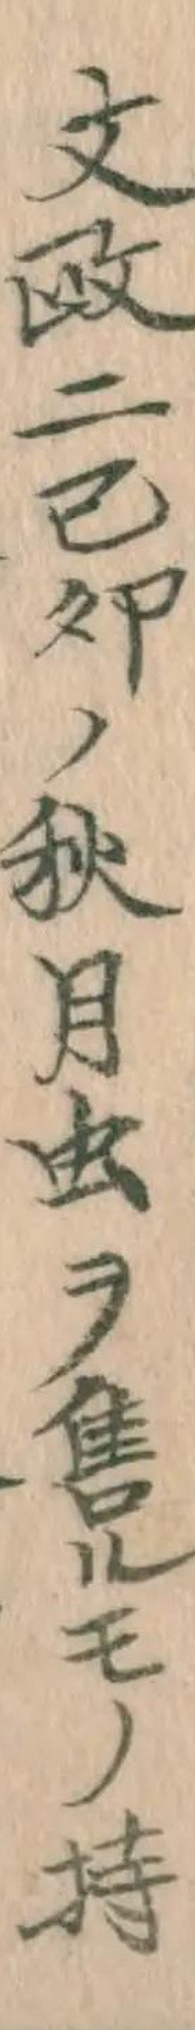文政二己卯ノ秋月虫ヲ售ルモノ持
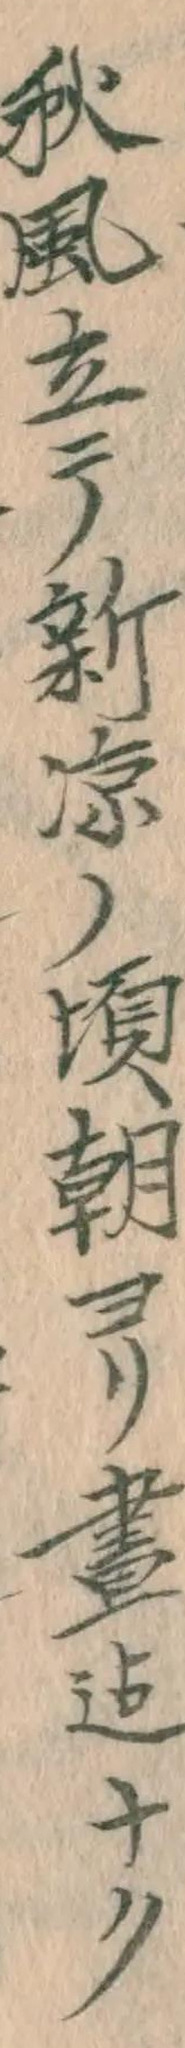秋風立テ新涼ノ頃朝ヨリ昼迄ナク
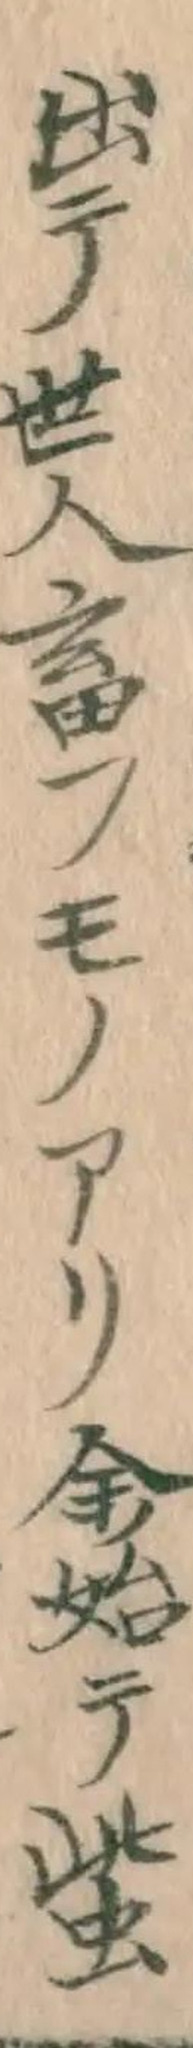出テ世人畜フモノアリ余始テ此虫
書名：千蟲譜 3巻. [3]
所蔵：国立国会図書館 National Diet Library, JAPAN
